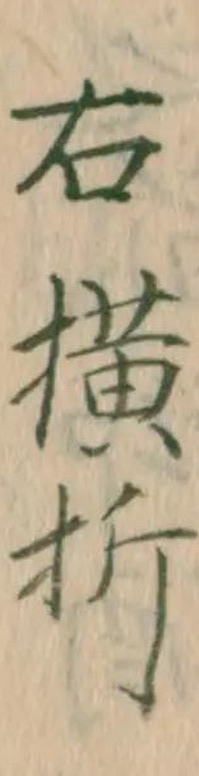右横折
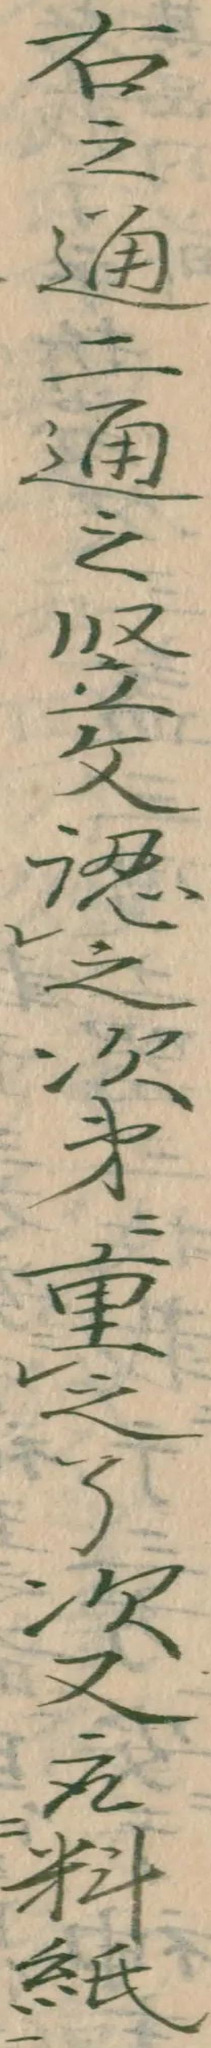右之通二通之竪文認之次第ニ重之了次又取料紙
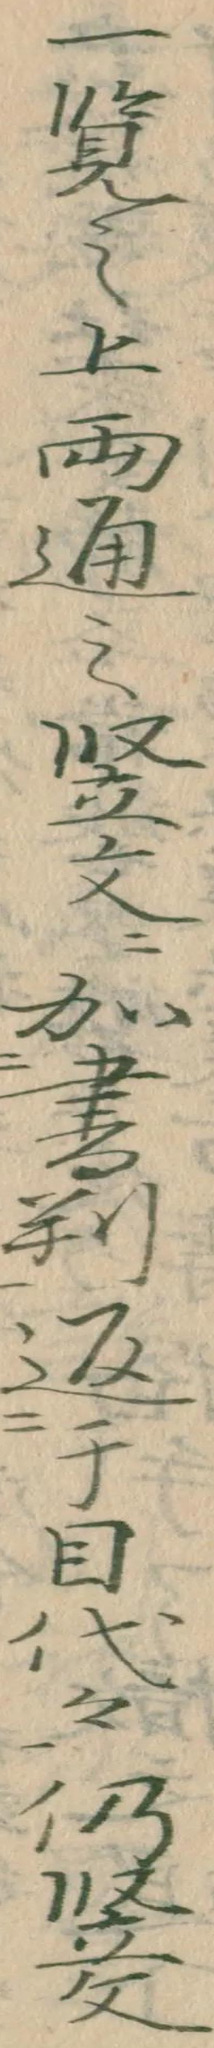一覧之上両通之竪文ニ加書判返于目代々仍竪文
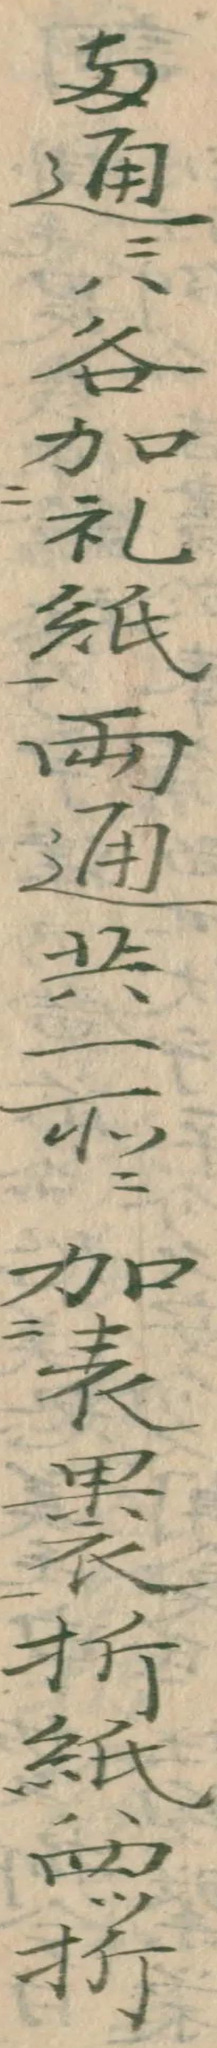両通ニハ各加礼紙両通共一所ニ加表褁折紙ハ四ツ折

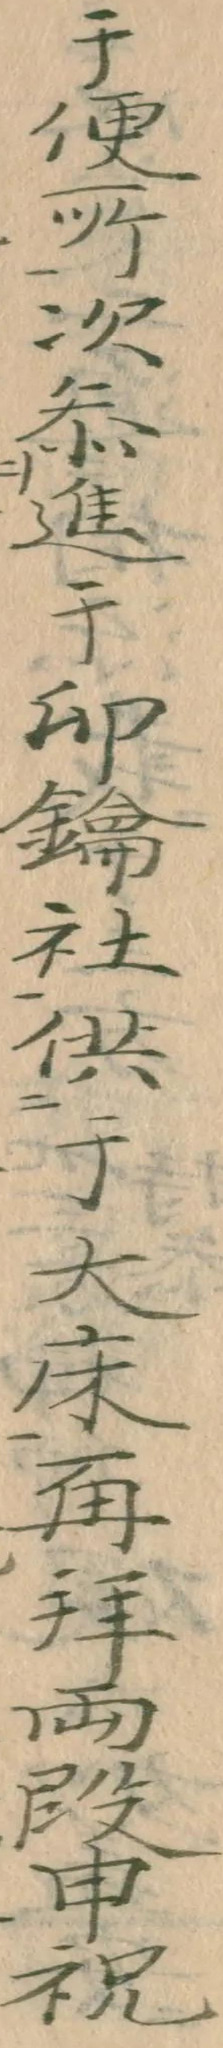于便所次参-進于卯鑰社供于大床再拝両段申祝
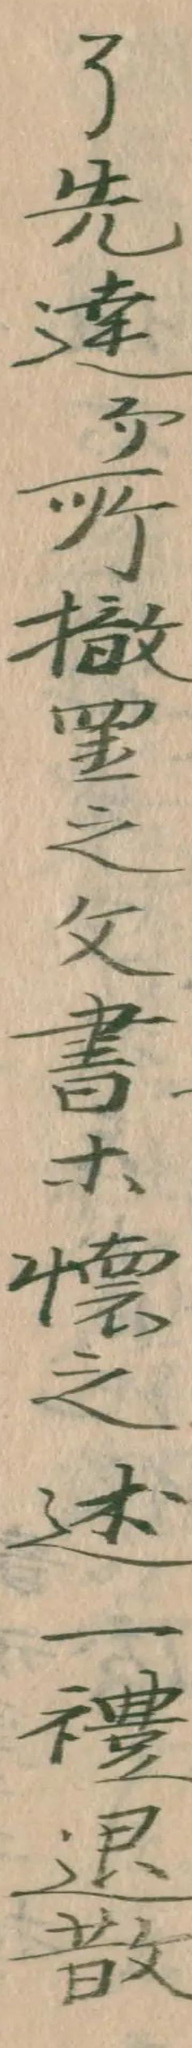了先達而所撤置之文書等懐之述一礼退散
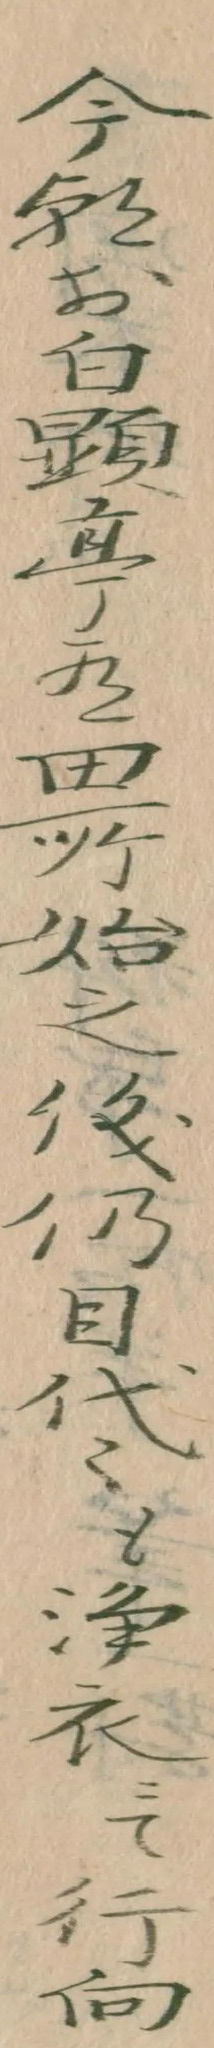一今朝お白顕亭有田所始之儀仍目代々も浄衣ニて行向
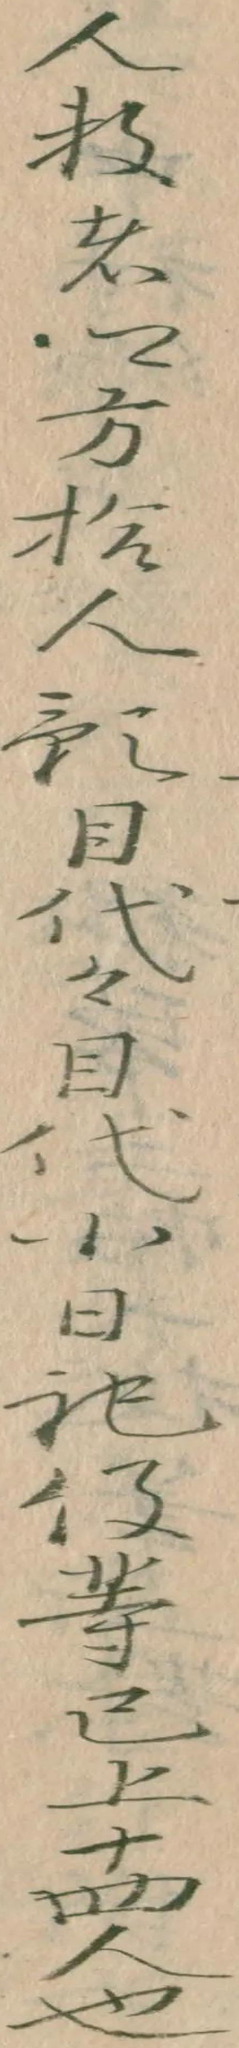人数者郷方拾人預目代々目代小日記役等已上十四人也
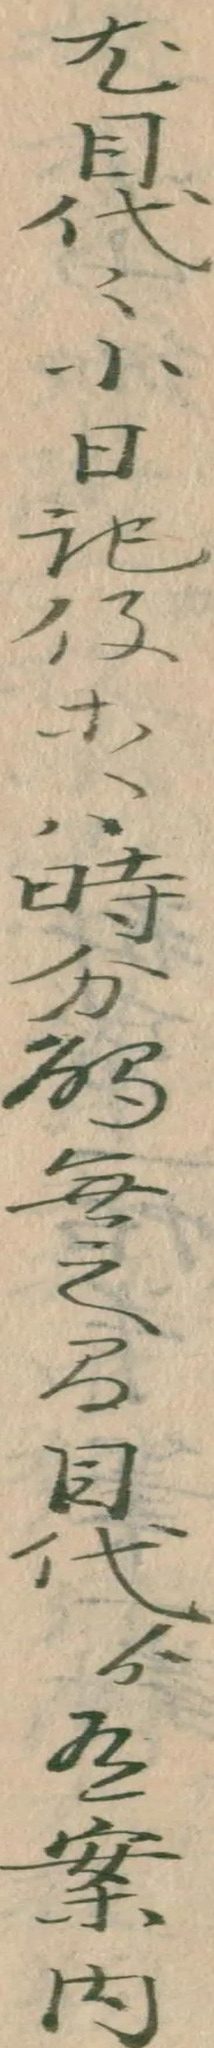尤目代々小日記役等へハ時分触無之間目代ゟ有案内
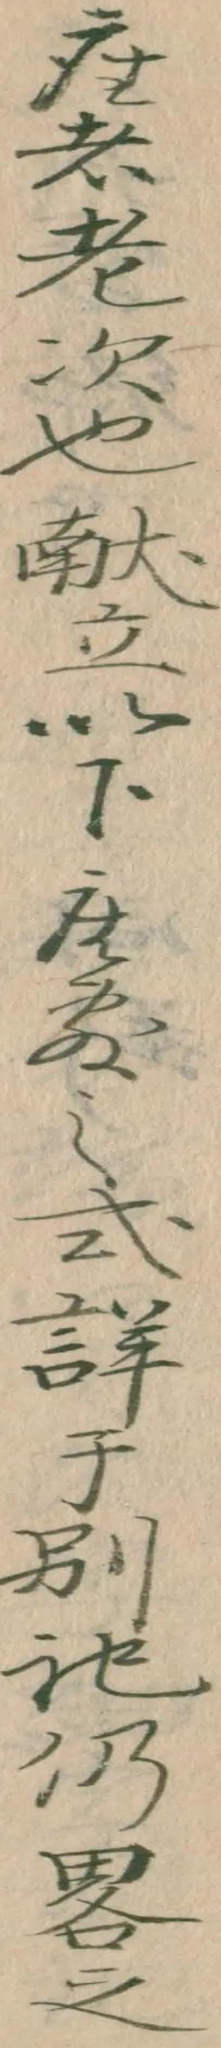座は老次也献立以下座敷之式詳于別記仍略之
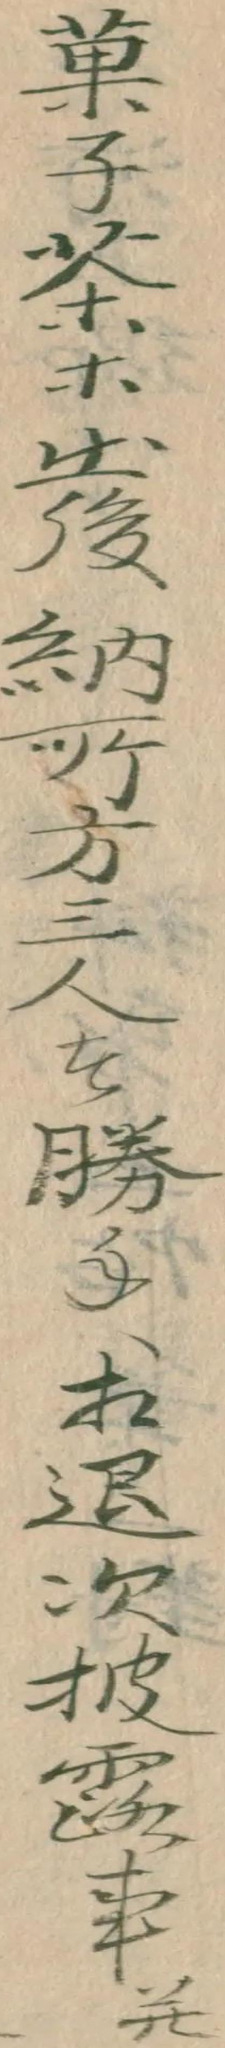菓子茶等出後納所方三人を勝手へ相退次披露事并
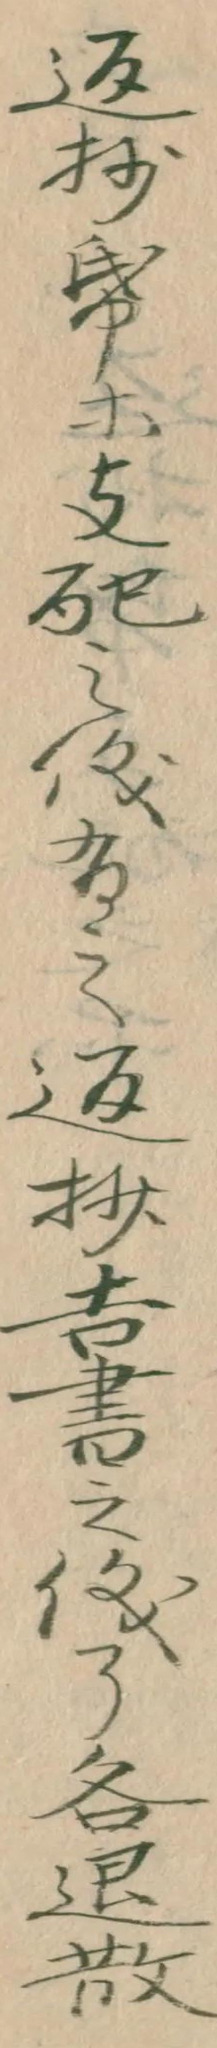返抄紙等支配之儀有之返捗吉書之儀了各退散

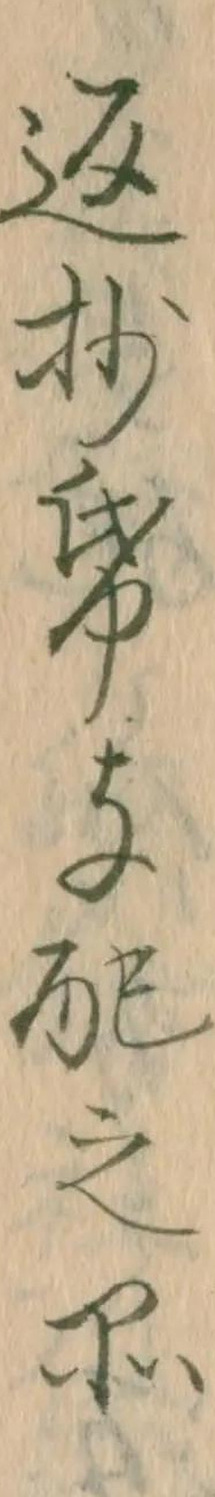返抄紙支配之品
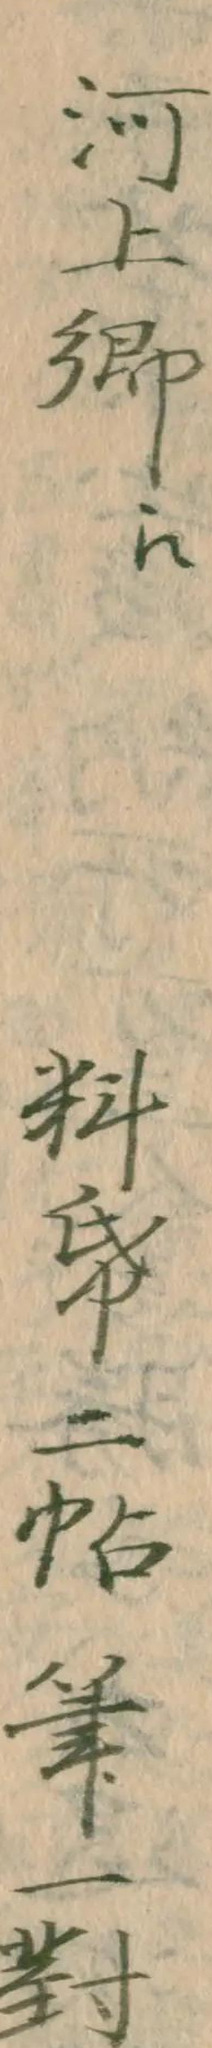河上郷江料紙二帖筆一対
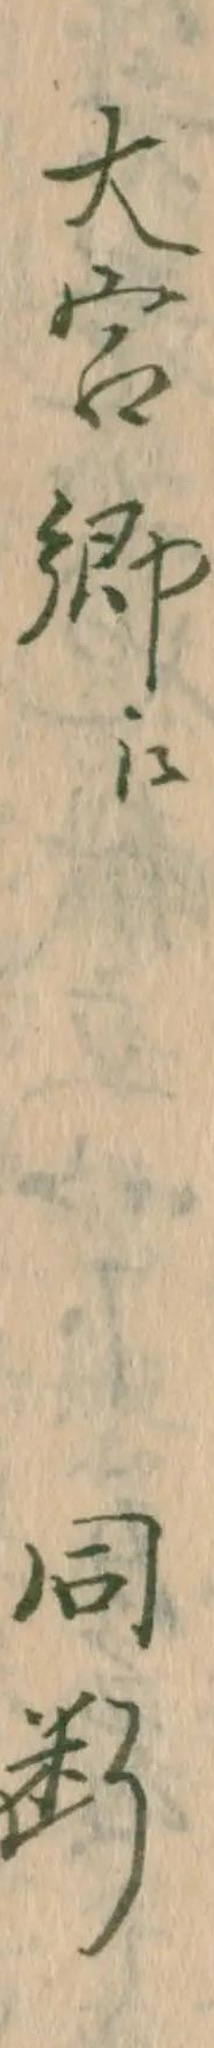大宮郷江同断
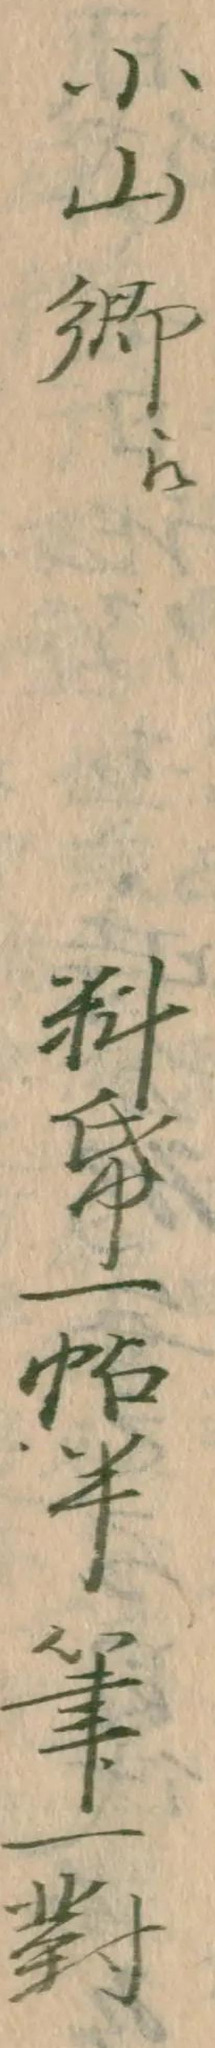小山郷江料紙一帖半筆一対
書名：賀茂社記録. 第26冊
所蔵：国立国会図書館 National Diet Library, JAPAN
